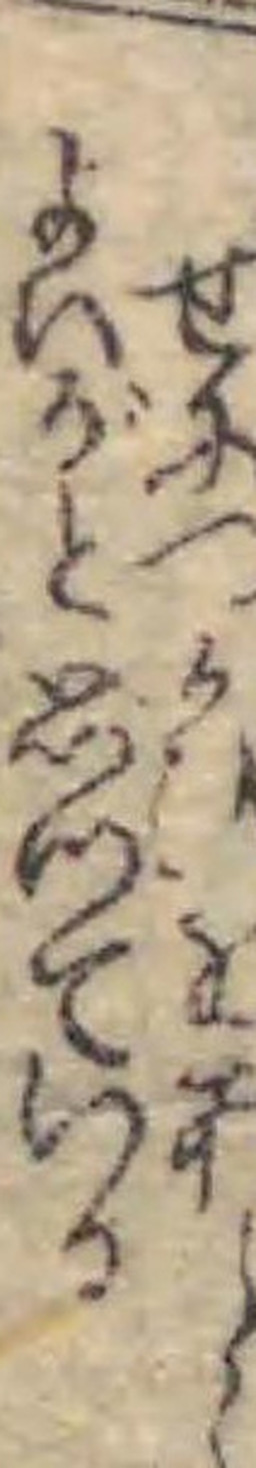よいがと思つている
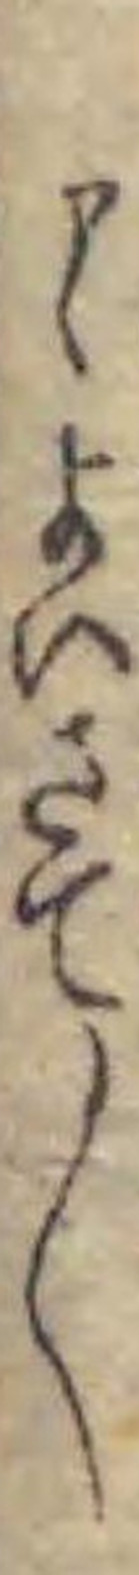アヽよいさて〳〵
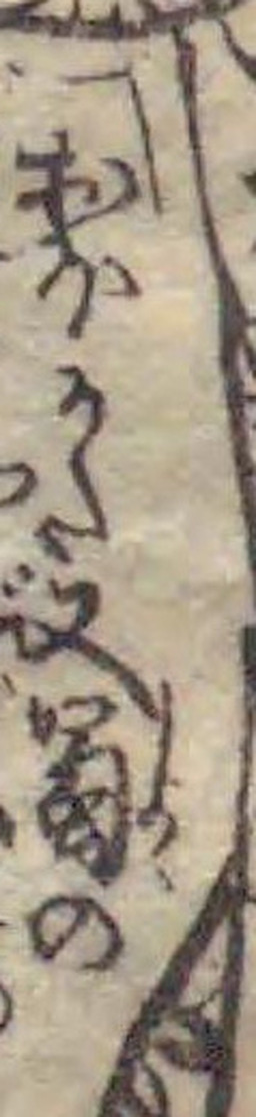〽おほかた又蜀の
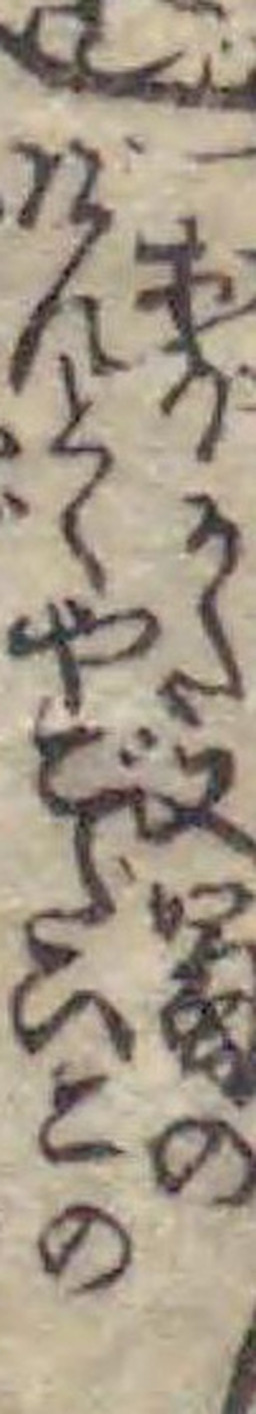げんとくやごたいこの
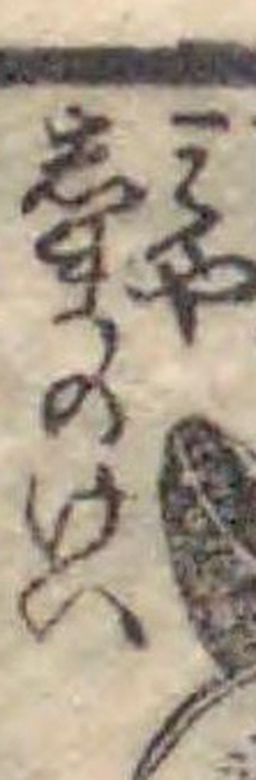しまのけい
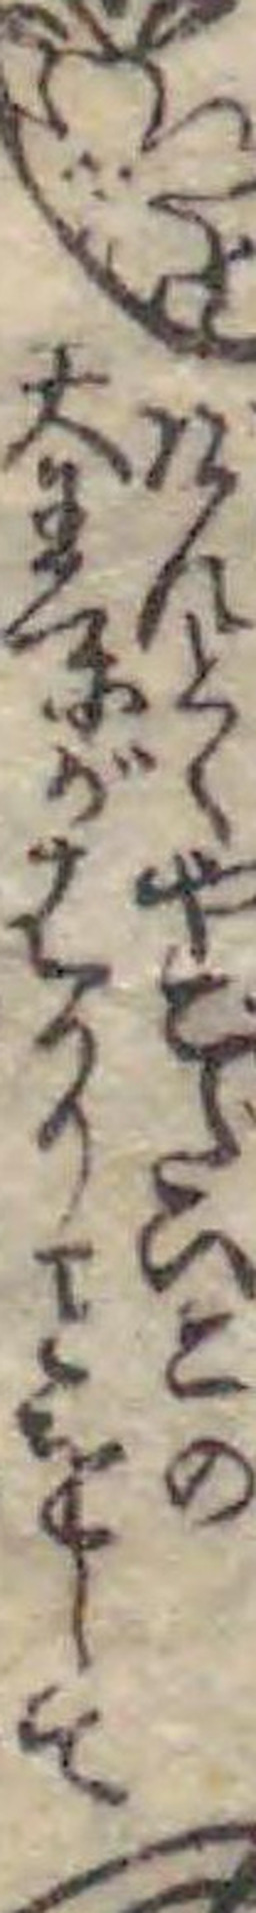大王様？がはかりことをして
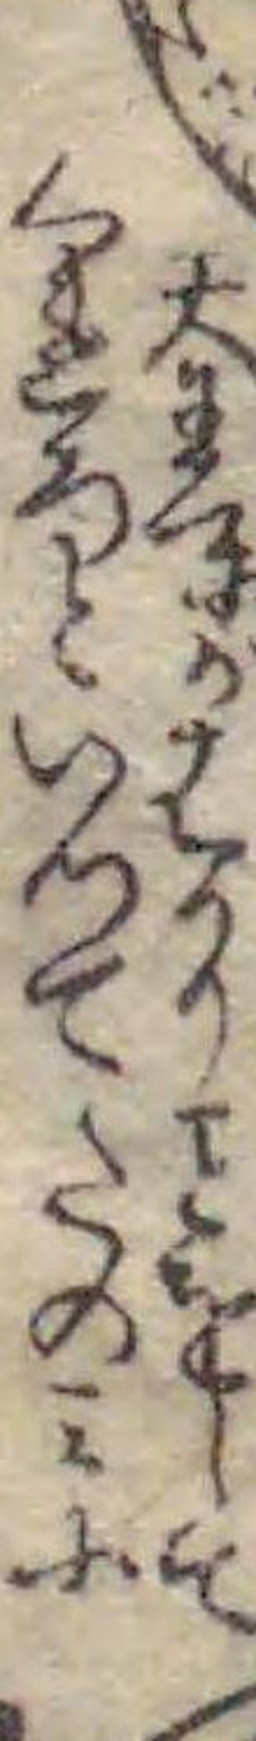くれろといつてたのみに
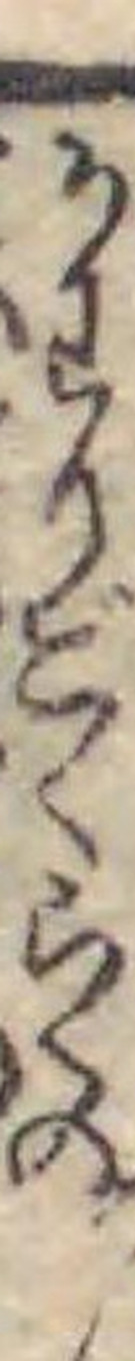かわりごくらくの
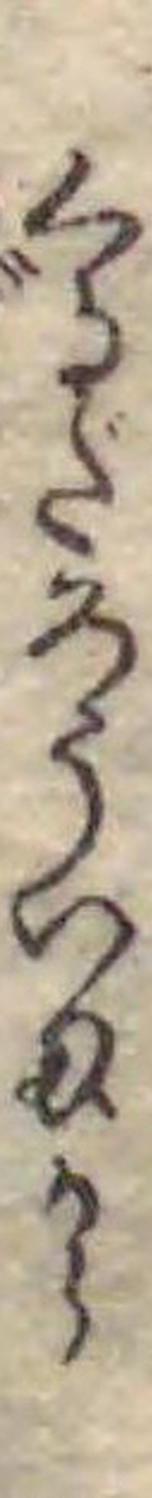くるだろういまから
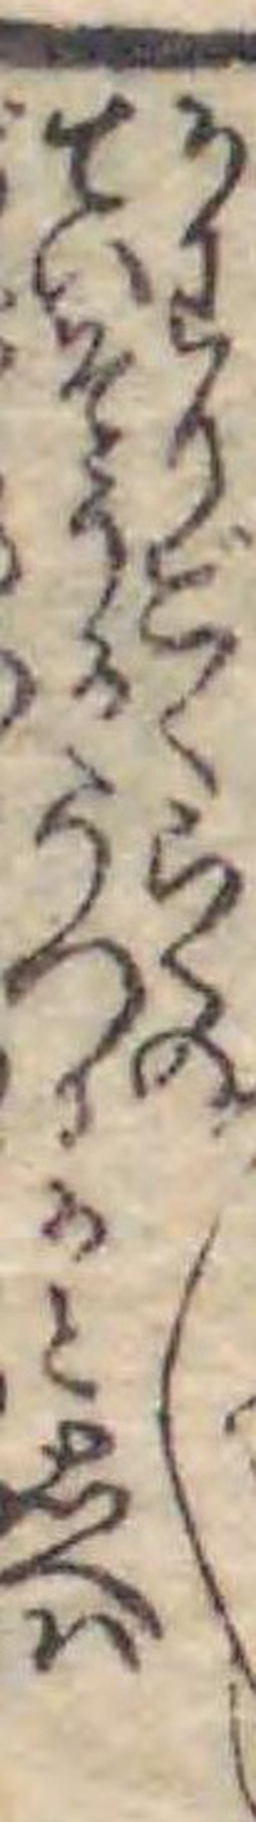ていそうかうつるかと思へは
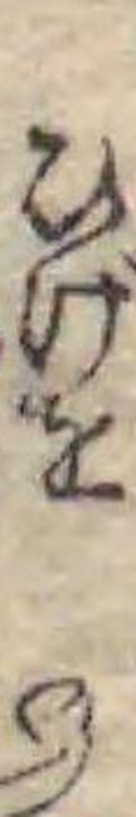ひげを
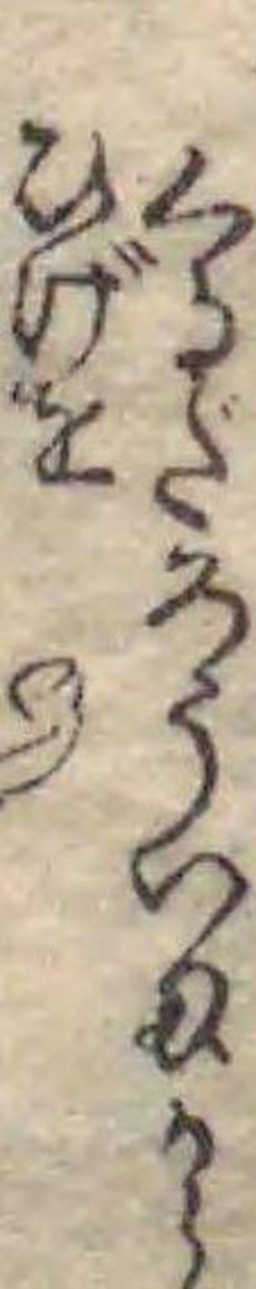ひげを
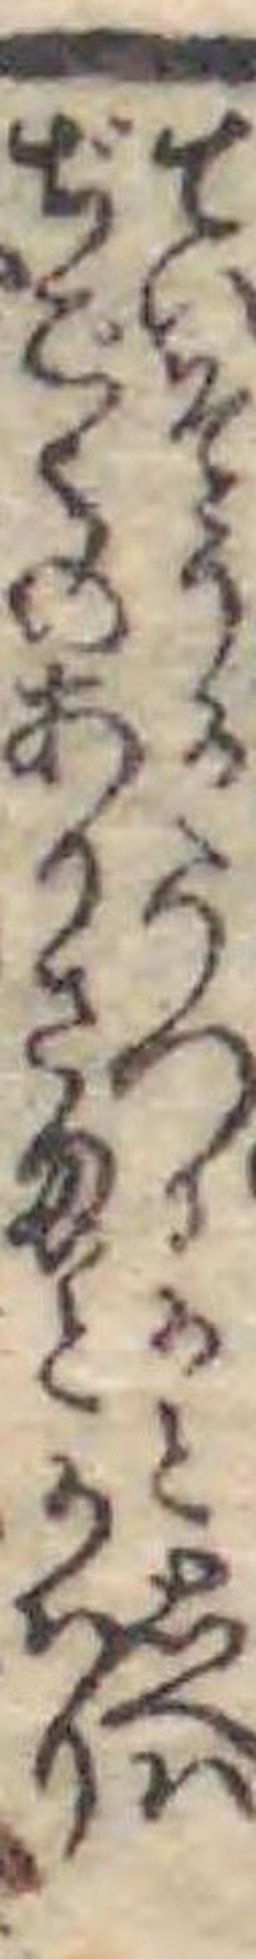ぢごくのありさまとかはり
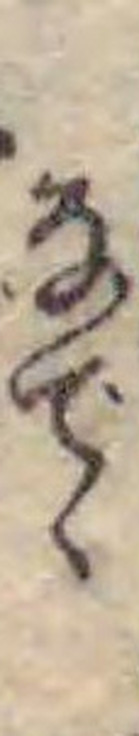なでて
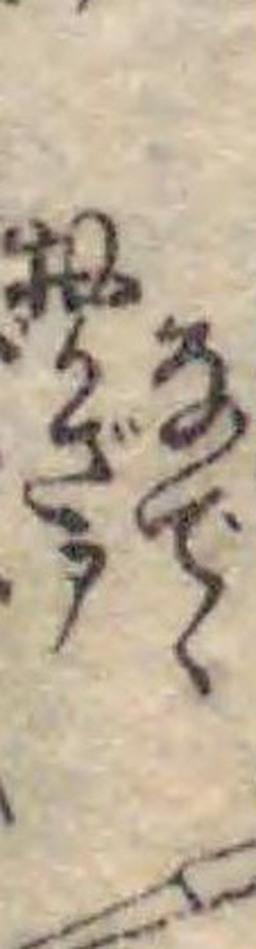おかざァ
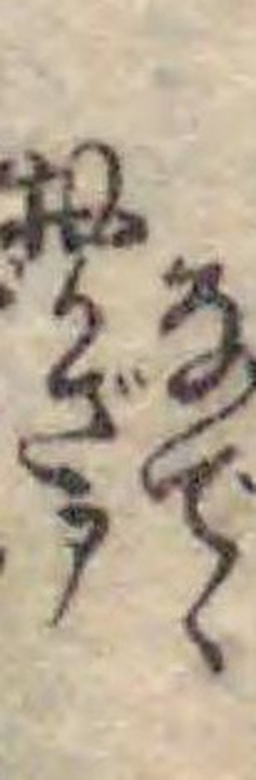おかざァ
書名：人心鏡写絵 : 3巻
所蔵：国立国会図書館 National Diet Library, JAPAN
